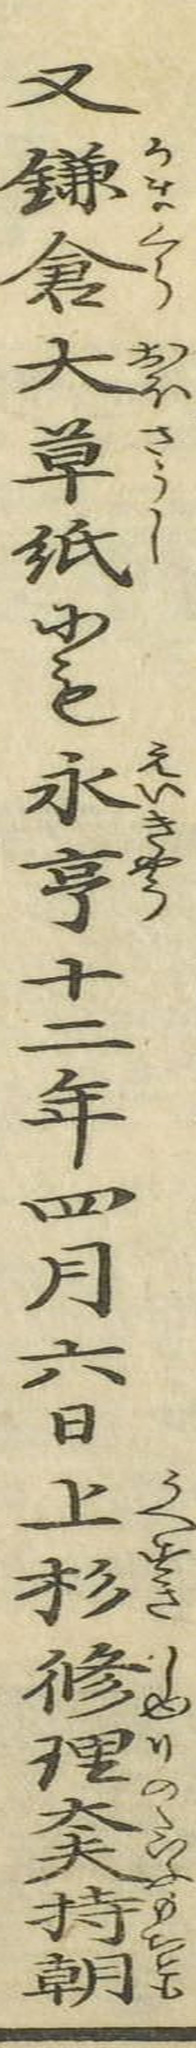又鎌倉大草紙にも永享十二年四月六日上杉修理太夫持朝
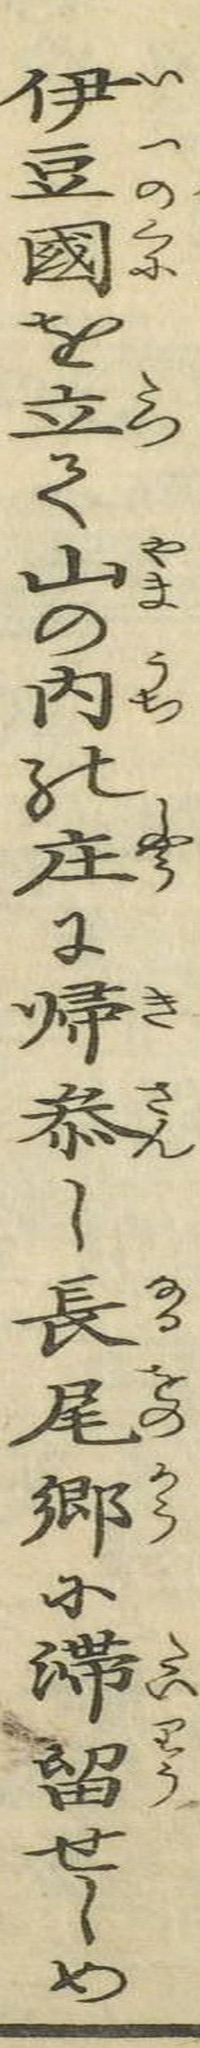伊豆國を立て山の内の庄に帰参し長尾郷に滞留せしめ
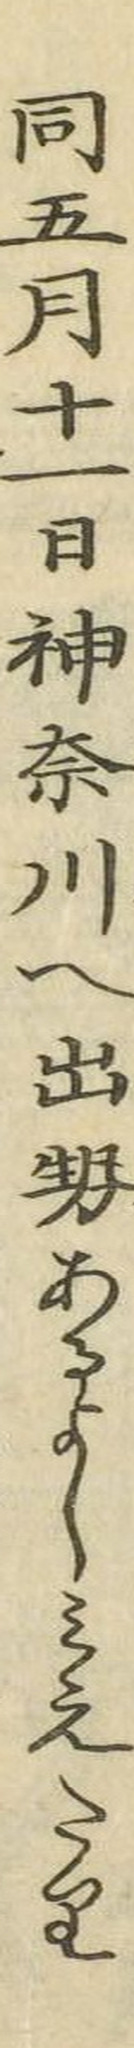同五月十一日神奈川へ出勢あるよしみえたり
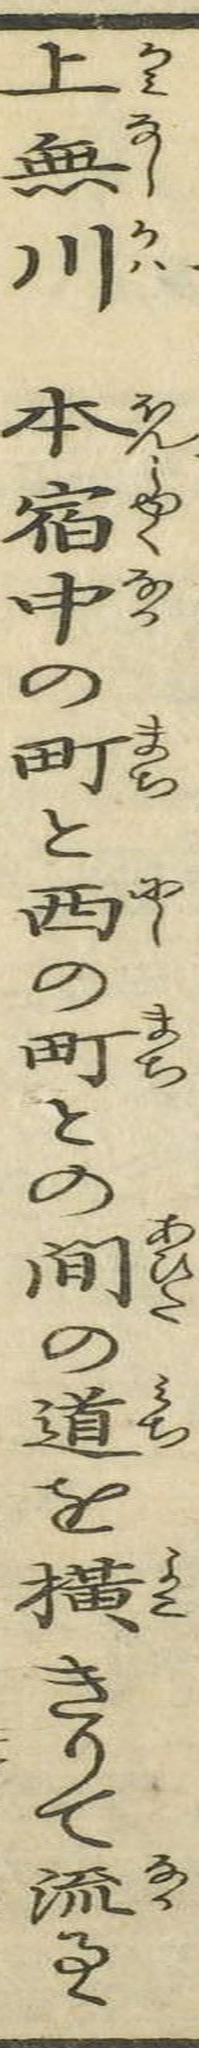上無川本宿中の町と西の町との間の道を横きりて流るゝ
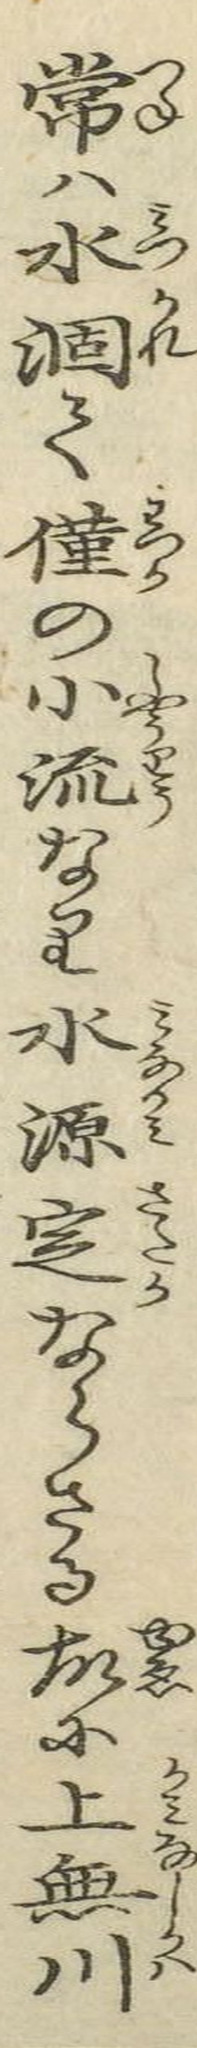常に水涸て僅の小流なり水源定ならさる故に上無川
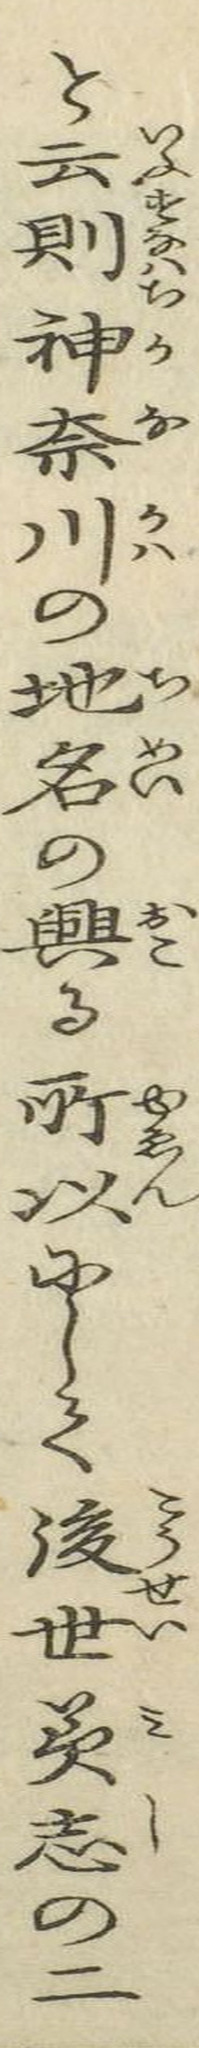と云則神奈川の地名の興る所以にして後世美志の二
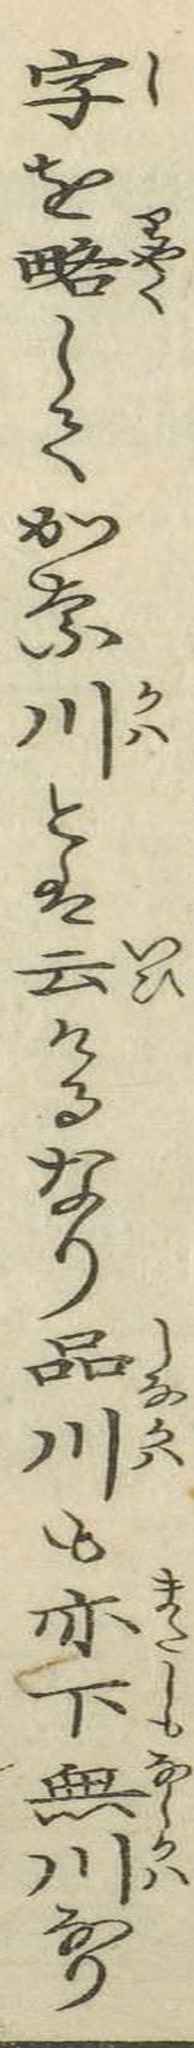字を略してかな川とは云けるなり品川も亦下無川なり
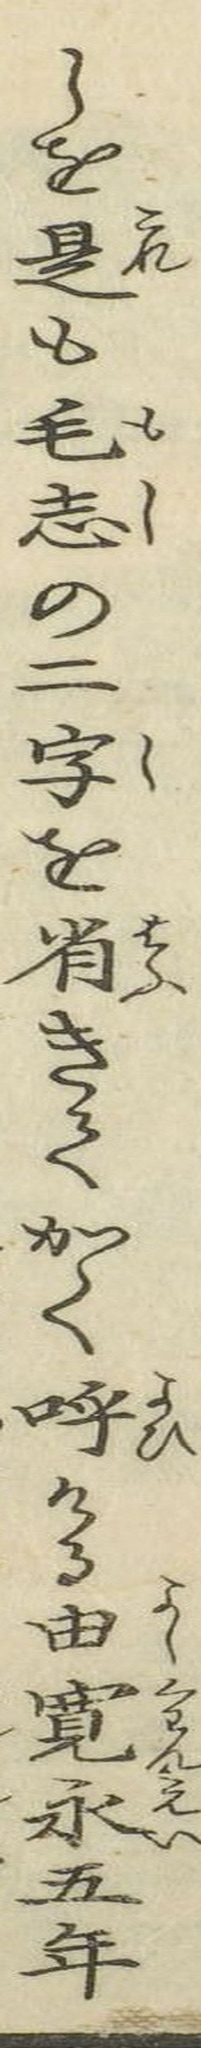しを是も毛志の二字を省きてかく呼ける由寛永五年
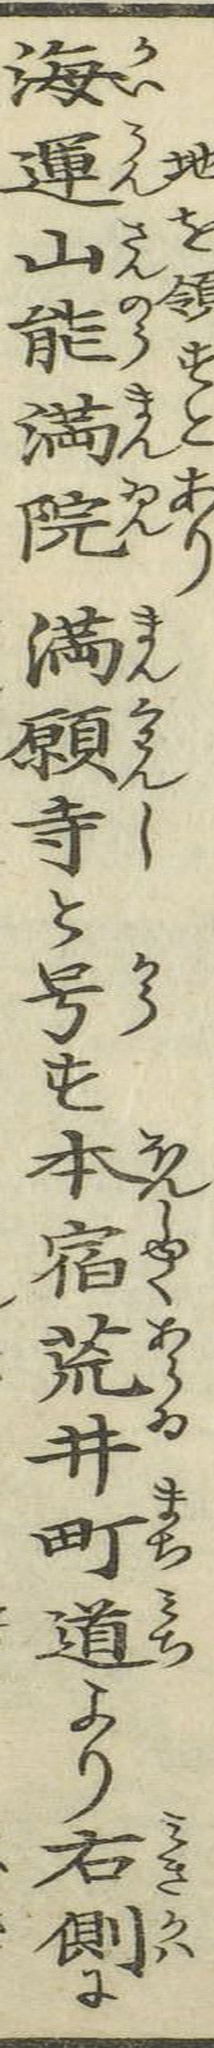海運山能満院満願寺と号す本宿荒井町道より右側に
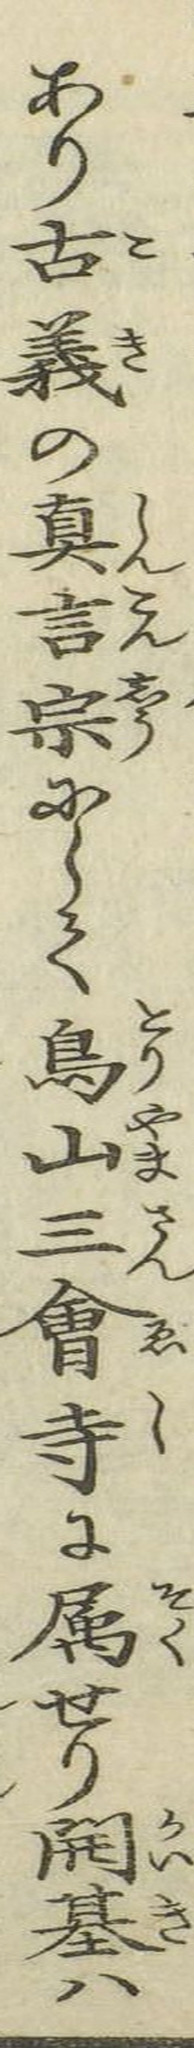あり古義の真言宗にして鳥山三會寺に属せり開基は
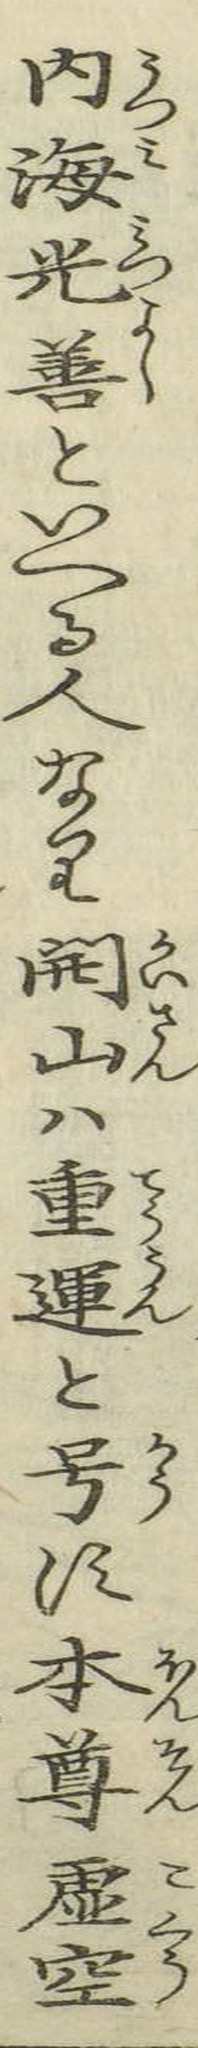内海光善といへる人なり開山は重運と号す本尊虚空
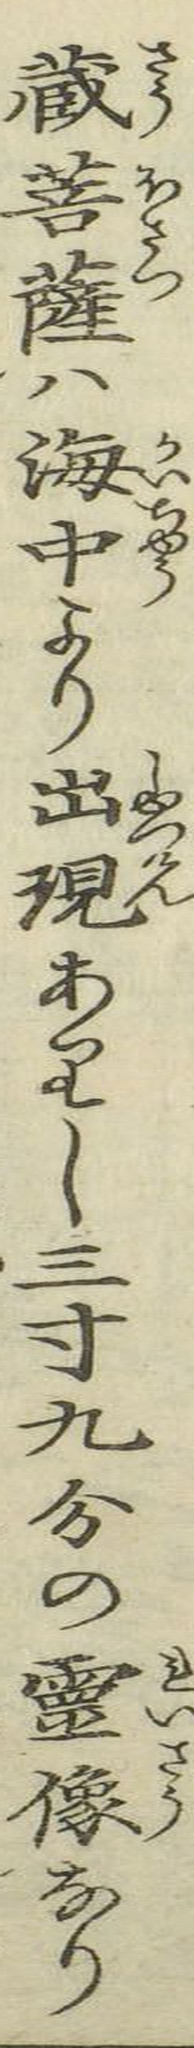蔵菩薩は海中より出現ありし三寸九分の霊像なり
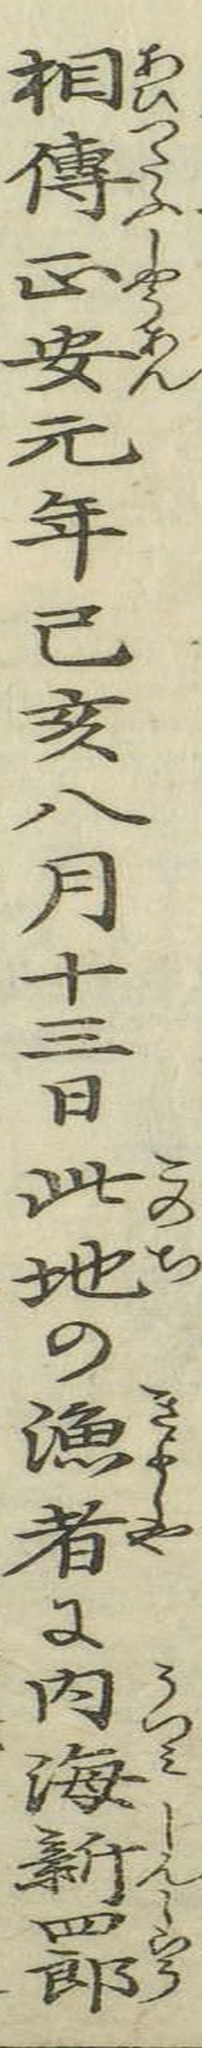相傳正安元年己亥八月十三日此地の漁者に内海新四郎
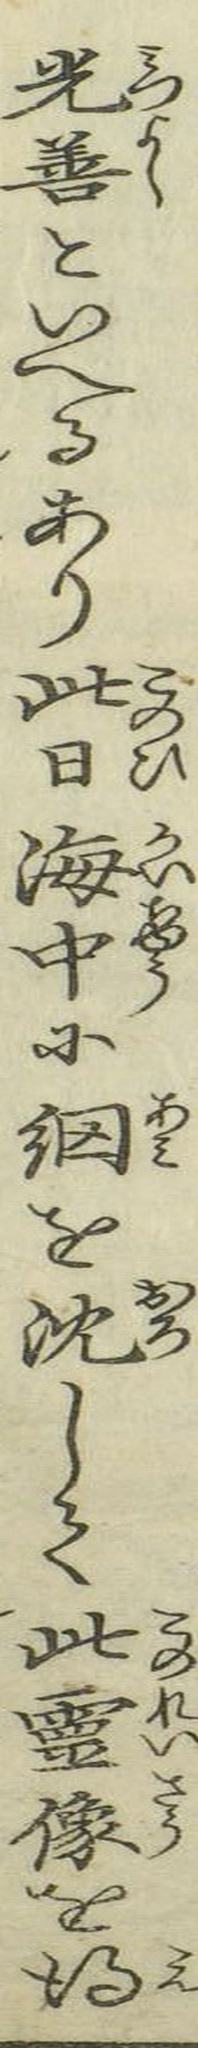光善といへるあり此日海中に網を沈して此霊像を得
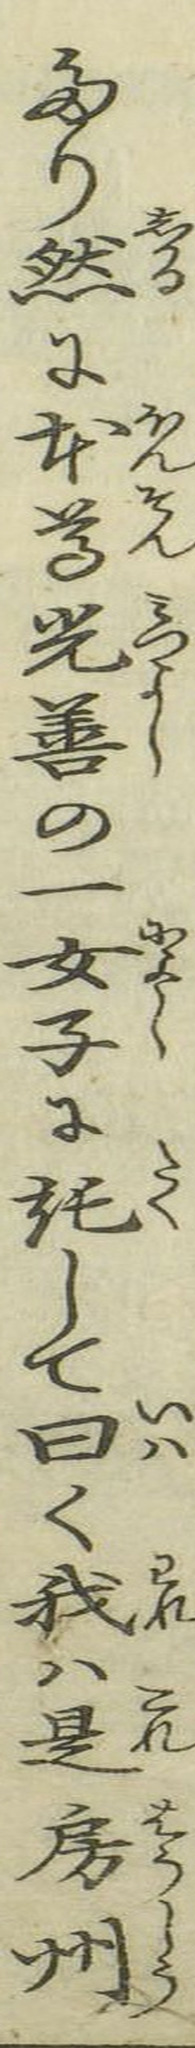たり然に本尊光善の一女子に託して曰く我は是房州

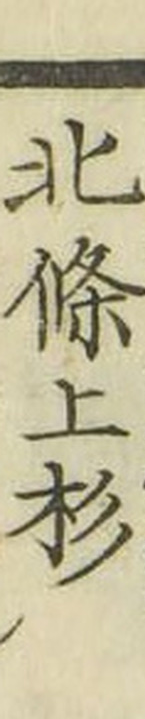北條上杉
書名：江戸名所図会 20巻 巻之5
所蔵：東京学芸大学教育コンテンツアーカイブ
